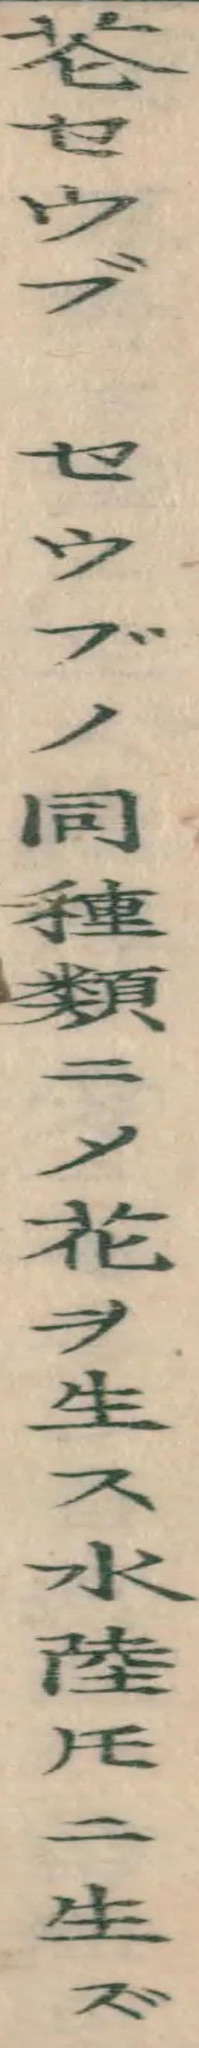花セウブセウブノ同種類ニシテ花ヲ生ス水陸トモニ生ズ
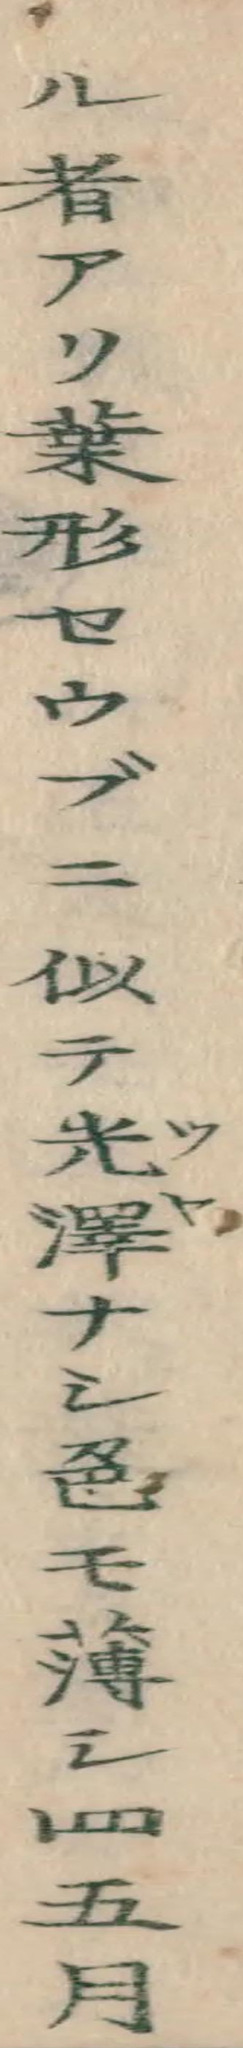ル者アリ葉形セウブニ似テ光沢ナシ色モ薄シ四五月
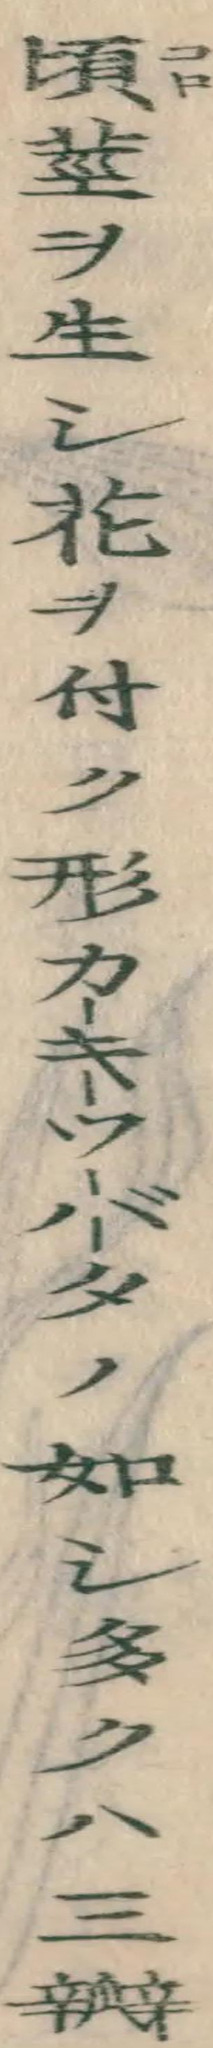頃茎ヲ生シ花ヲ付ク形カ-キ-ツ-バ-タノ如シ多クハ三弁
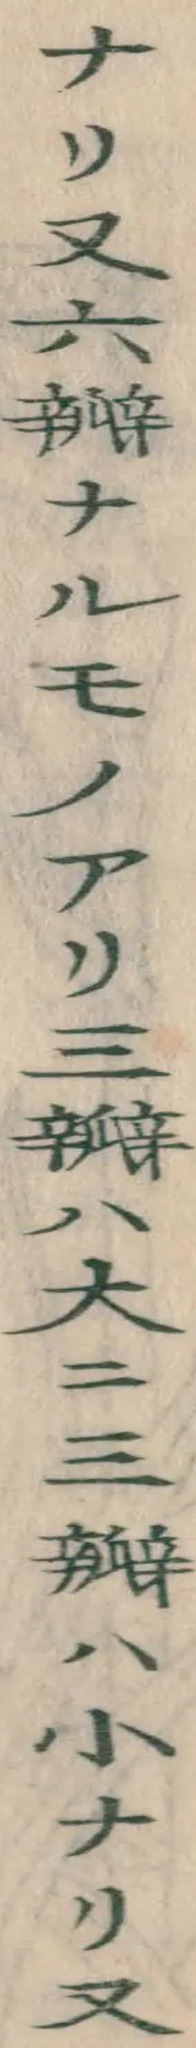ナリ又六弁ナルモノアリ三弁ハ大ニ三弁ハ小ナリ又
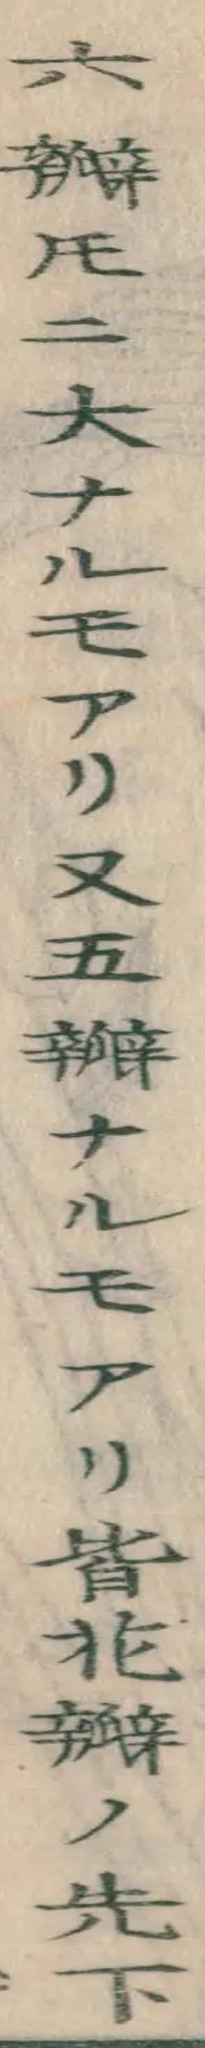六弁トモニ大ナルモアリ又五弁ナルモアリ皆花弁ノ先下
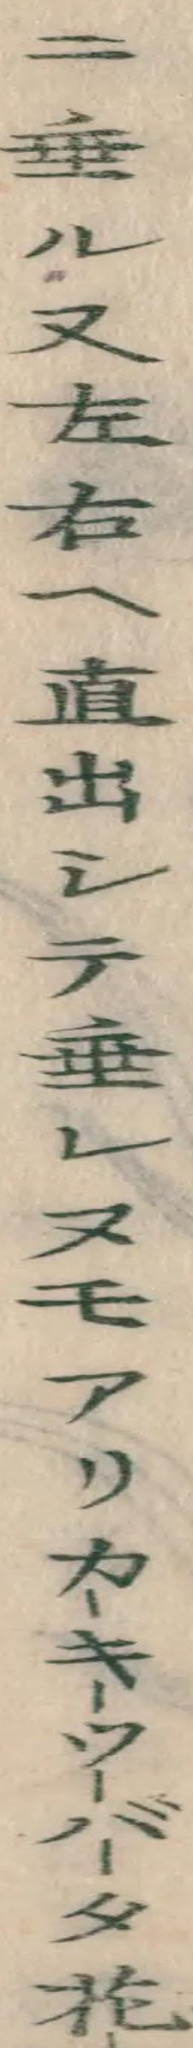ニ垂ル又左右ヘ直出シテ垂レヌモアリカ-キ-ツ-バ-タ花-
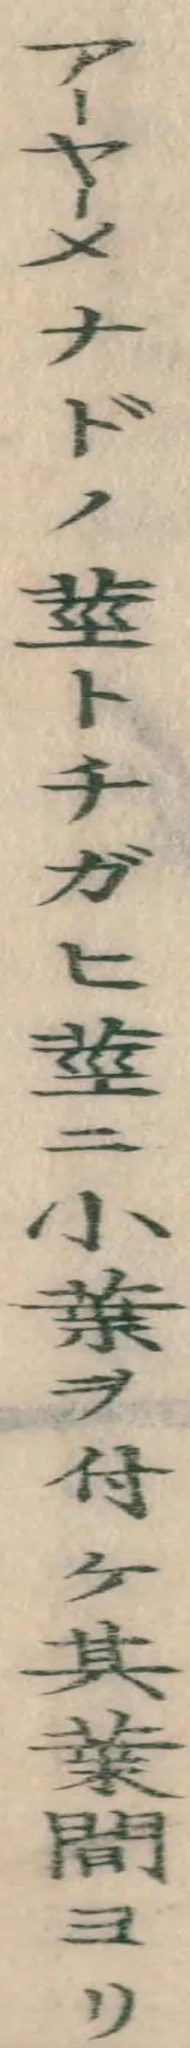ア-ヤ-メナドノ茎トチガヒ茎ニ小葉ヲ付ケ其葉間ヨリ
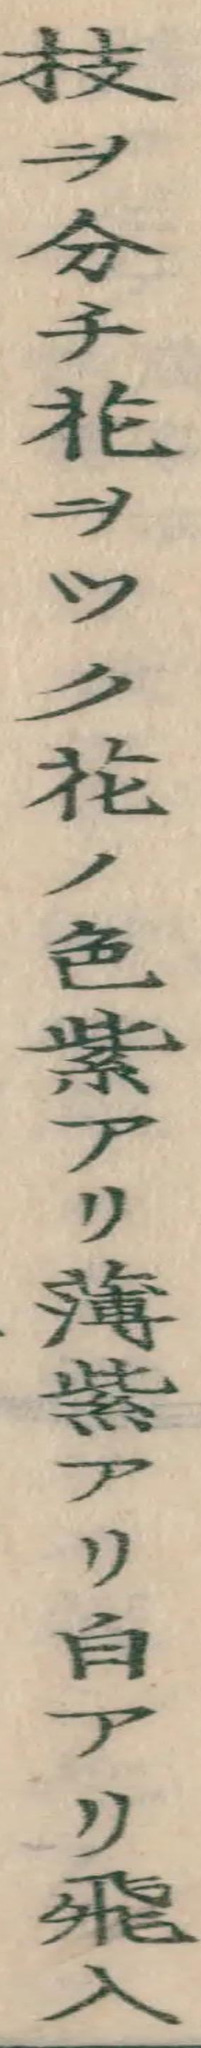枝ヲ分チ花ヲツク花ノ色紫アリ薄紫アリ白アリ飛入
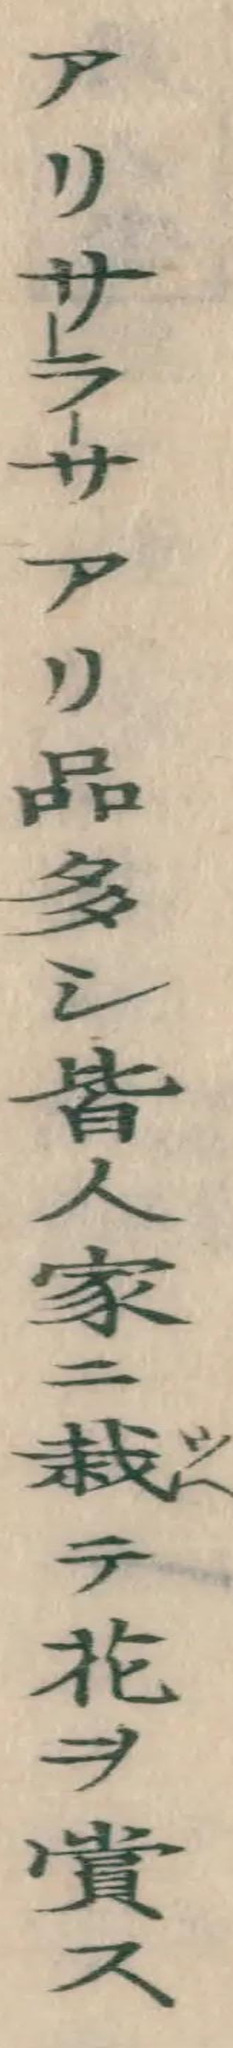アリサ-ラ-サアリ品多シ皆人家ニ栽テ花ヲ賞ス

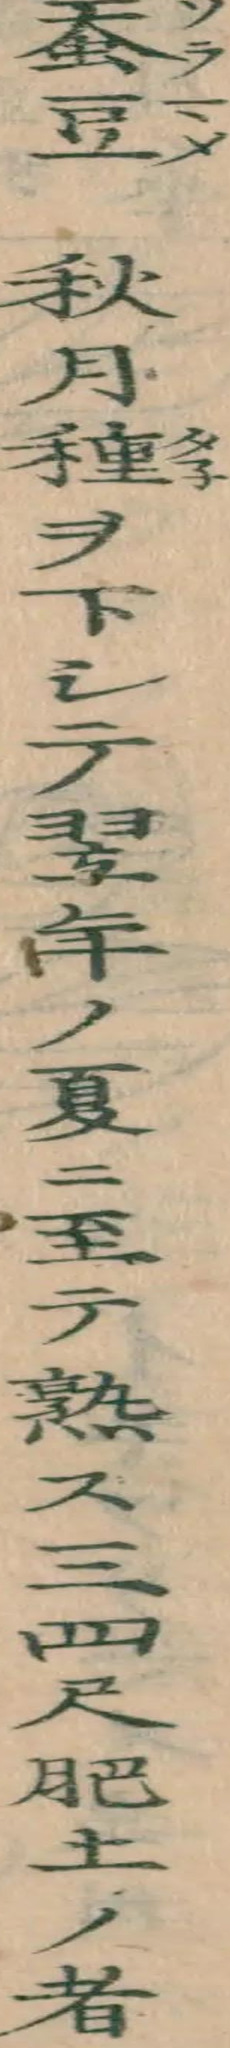蚕豆秋月種ヲ下シテ翌年ノ夏ニ至テ熟ス三四尺肥土ノ者
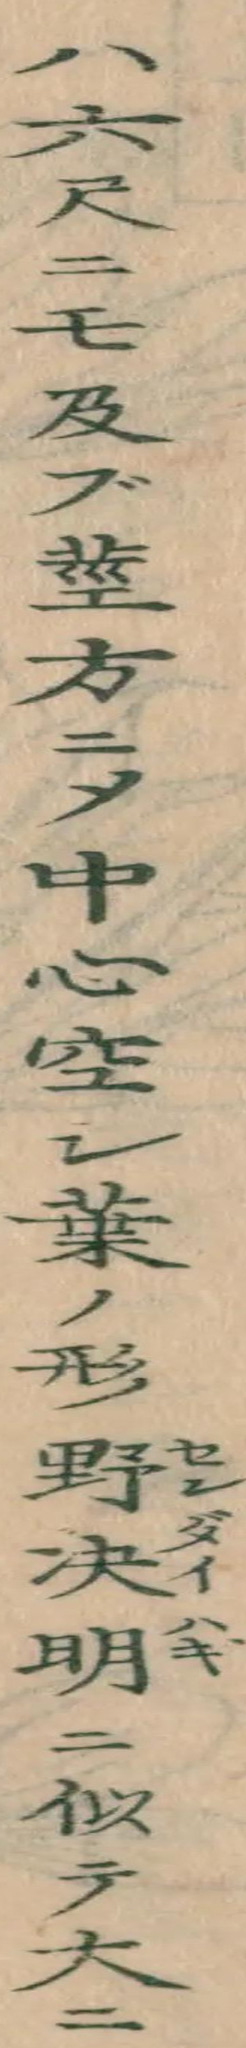ハ六尺ニモ及ブ茎方ニシテ中心空シ葉ノ形野决明ニ似テ大ニ
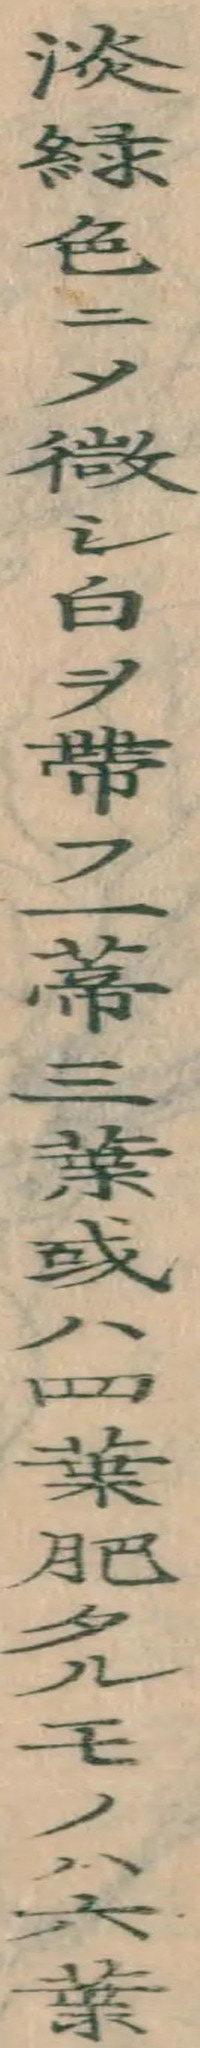淡緑色ニシテ微シ白ヲ帯フ一蒂三葉或ハ四葉肥タルモノハ六葉
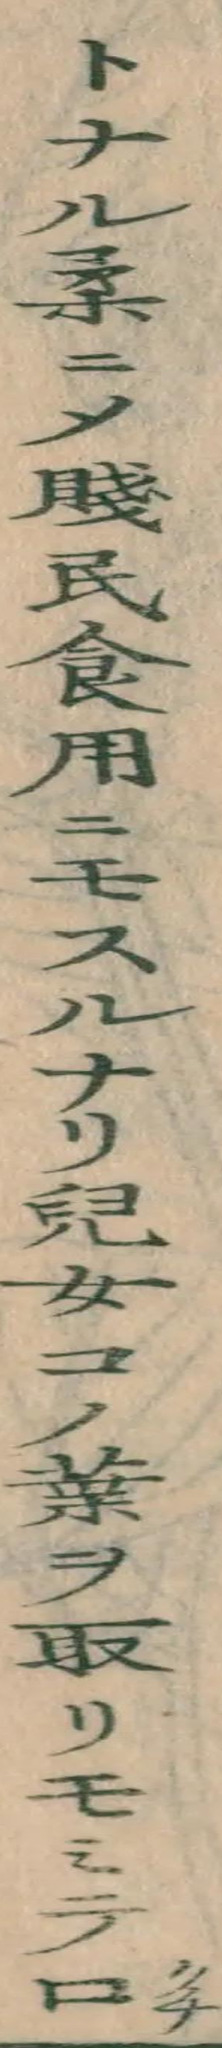トナル柔ニシテ賤民食用ニモスルナリ児女コノ葉ヲ取リモミテ口
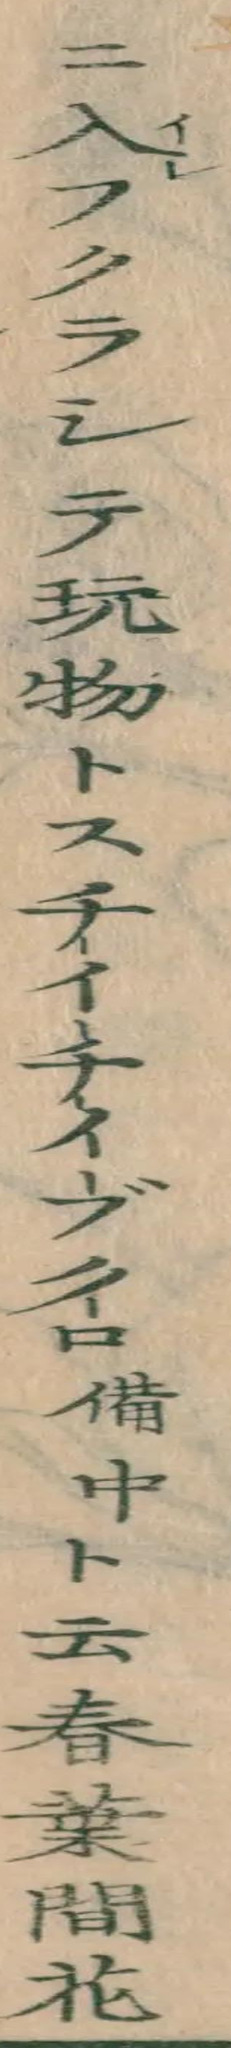ニ入フクラシテ玩物トスチ-イ-チ-イ-ブ-ク-ロ備中ト云春葉間花
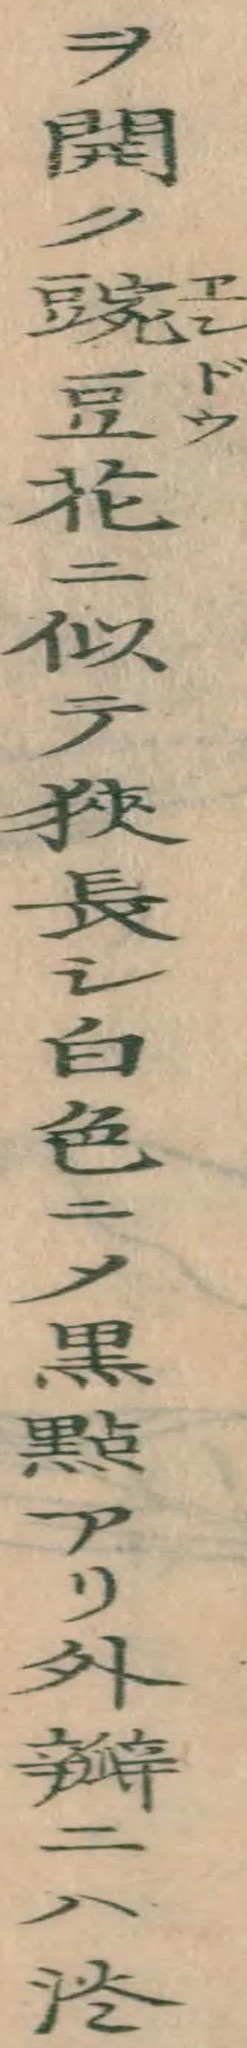ヲ開ク豌豆花ニ似テ狭長シ白色ニシテ黒点アリ外弁ニハ淡
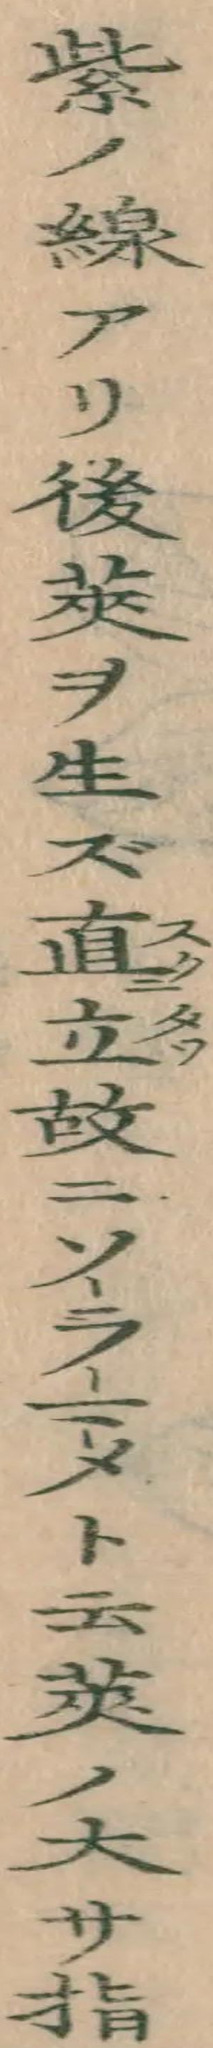紫ノ線アリ後莢ヲ生ズ直立故ニソ-ラ-マ-メト云莢ノ大サ指
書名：これこれ草 2巻. [2]
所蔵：国立国会図書館 National Diet Library, JAPAN
